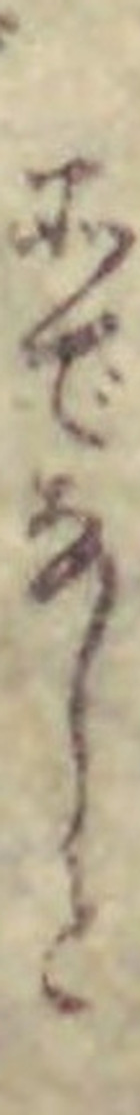所でなしと
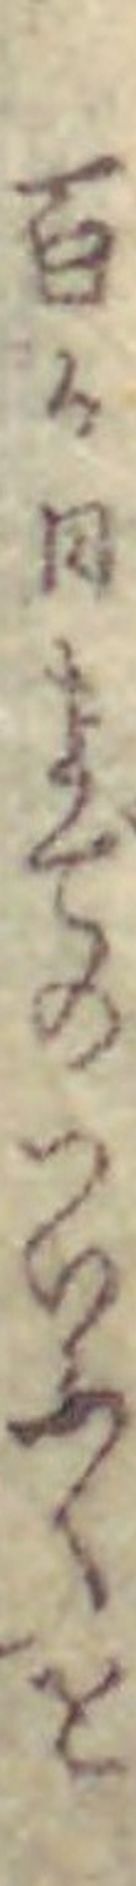百か日までのついふくを
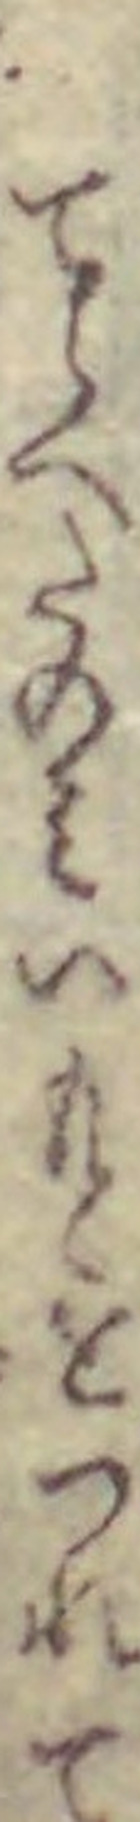てらへたのみいもとをつれて
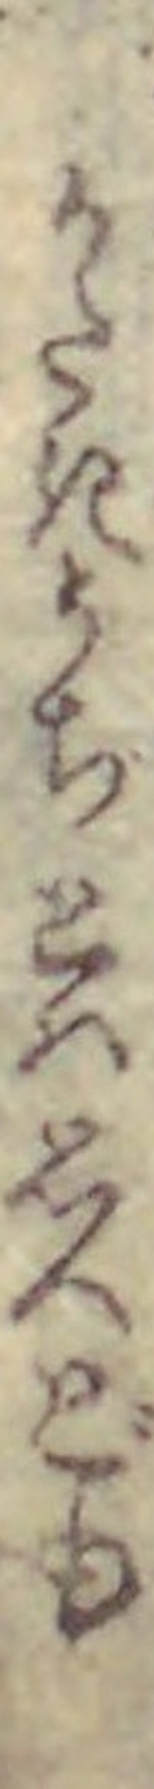かたきうちとは思へども
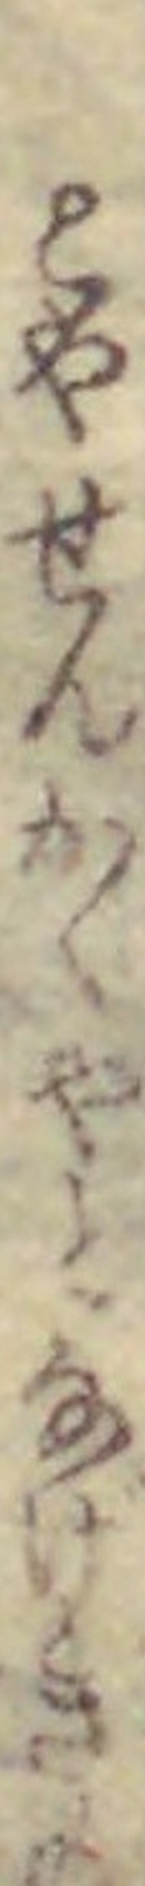とやせんかくやとなげきの
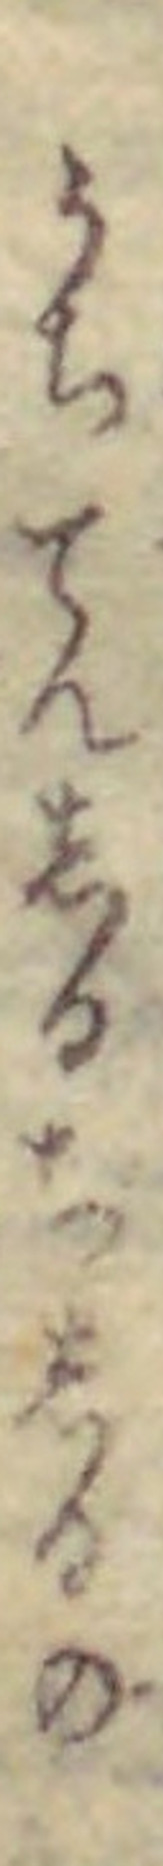うちてんしるちしるの
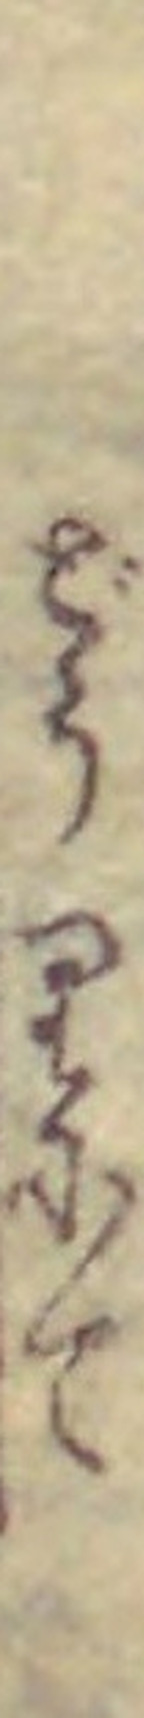どうりにて

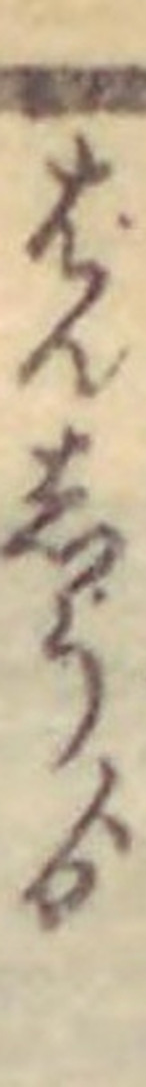ばんしうゟ
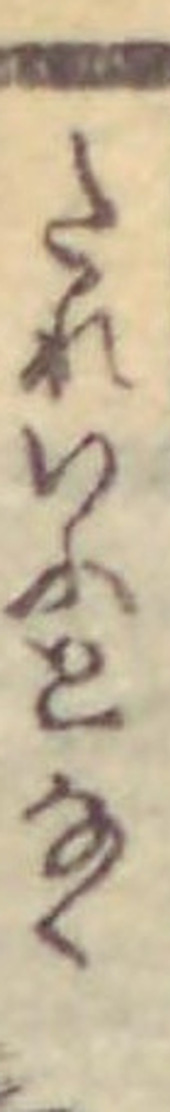たれいふとなく
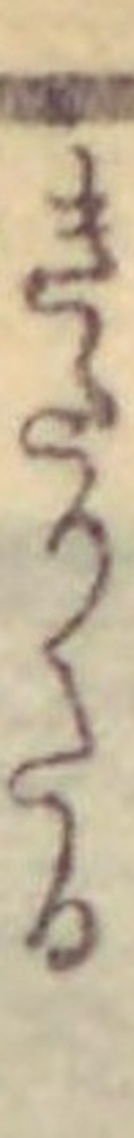きたりたる
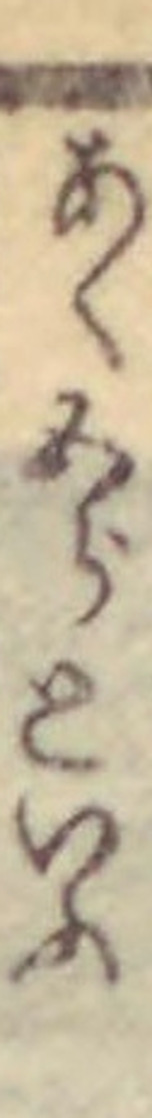あく五郎といふ
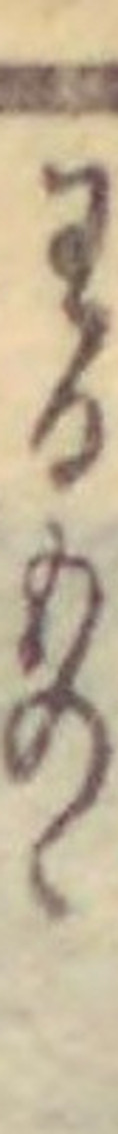わるものゝ
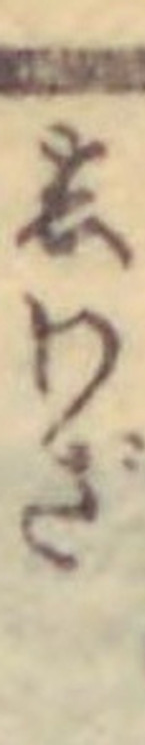しわざ
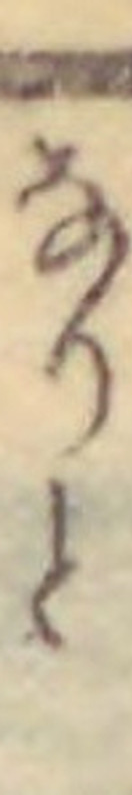なりと
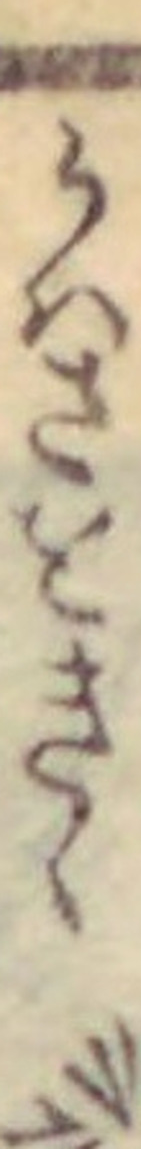うはさをきゝ
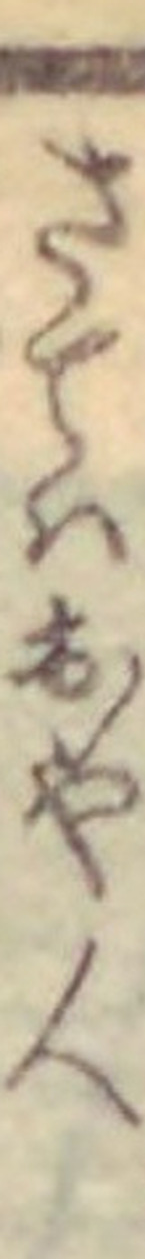さてはおや人
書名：八ツ目鱣因縁物語 3巻
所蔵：国立国会図書館 National Diet Library, JAPAN
